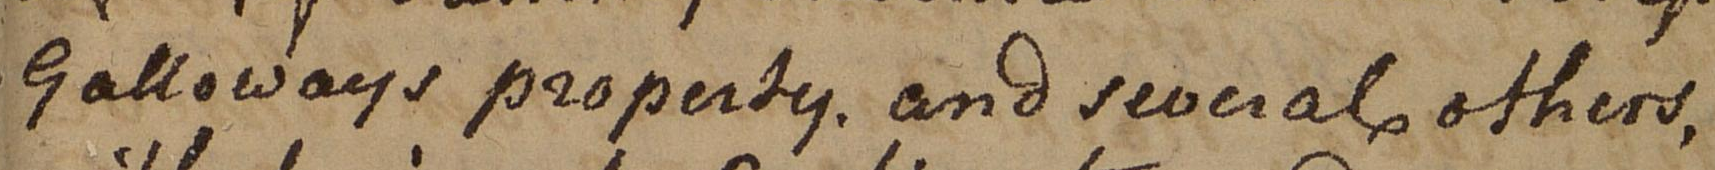Galloways property, and several others,
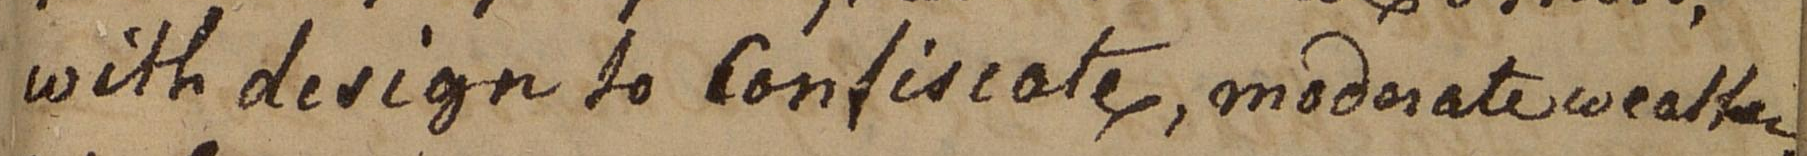with design to Confiscate, moderate weather
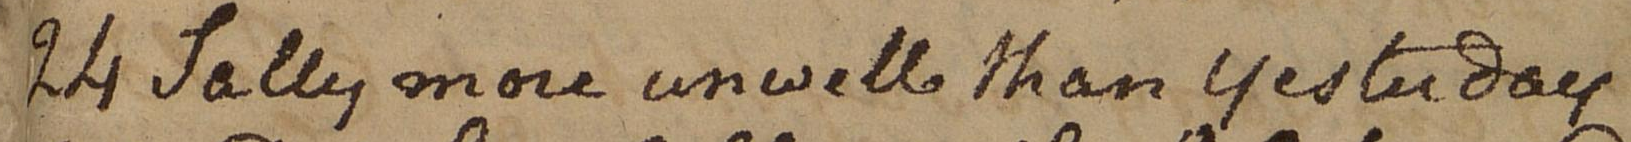24 Sally more unwell than Yesterday
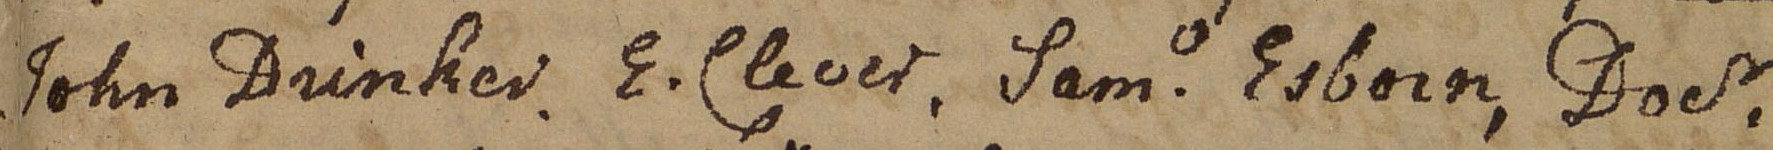John Drinker, E: Clever, Sam^l. Esborn, Doc.^r
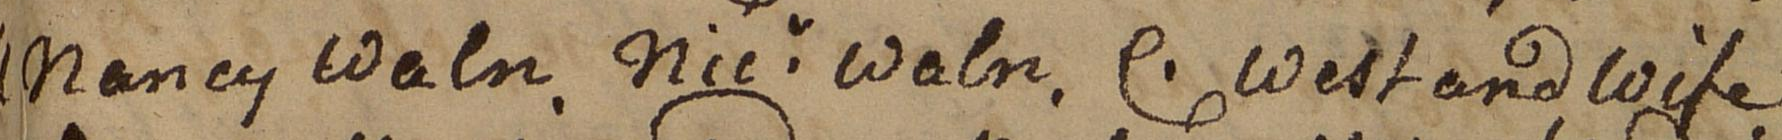Nancy Waln, Nic^s. Waln, C, West and wife
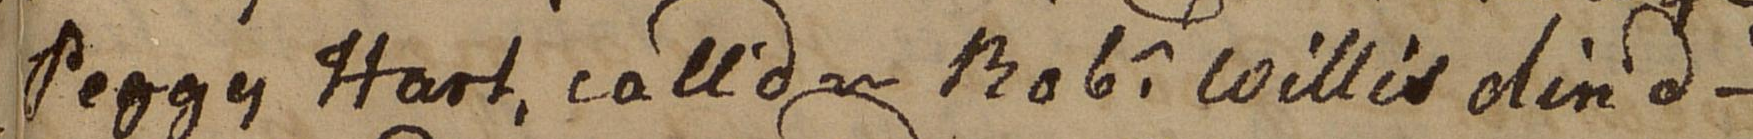Peggy Hart, call'd- Rob^r. Willis din'd-
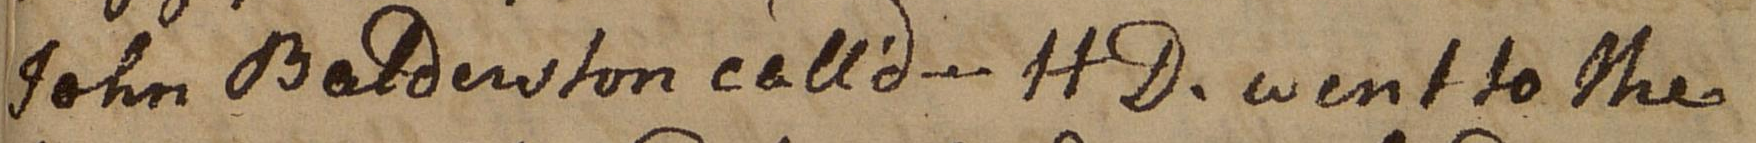Jahn Balderston call'd- H D. went to the
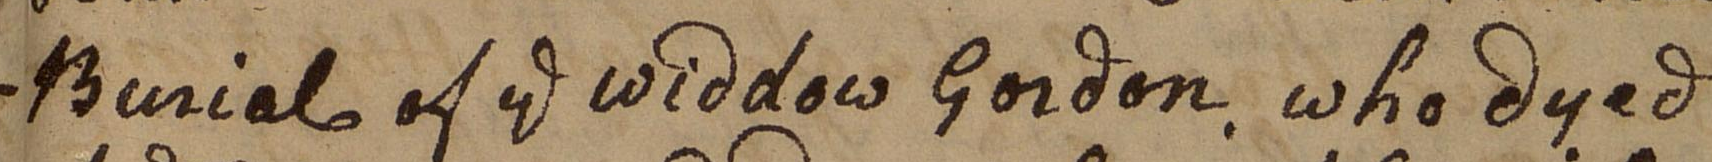Burial of y^e widdow Gordon, who dyed
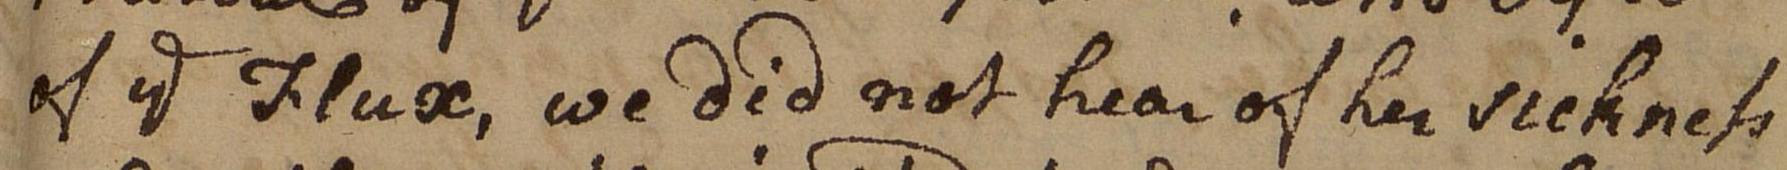of y^e Flux, we did not hear of her sickness
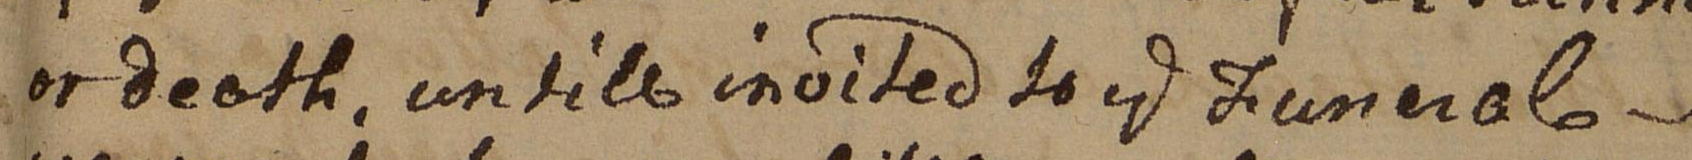or death, untill invited to y^e Funeral-
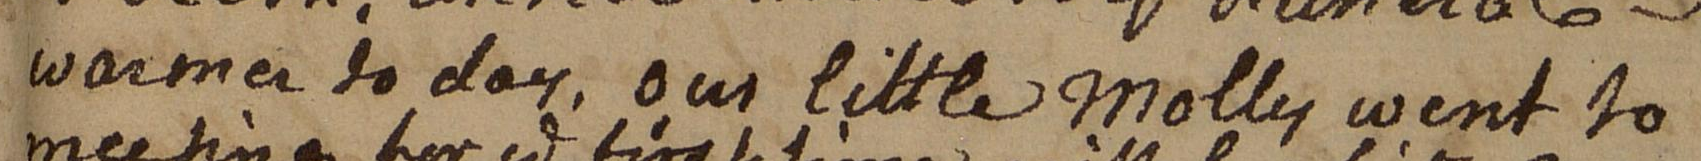warmer to day, our little molly went to
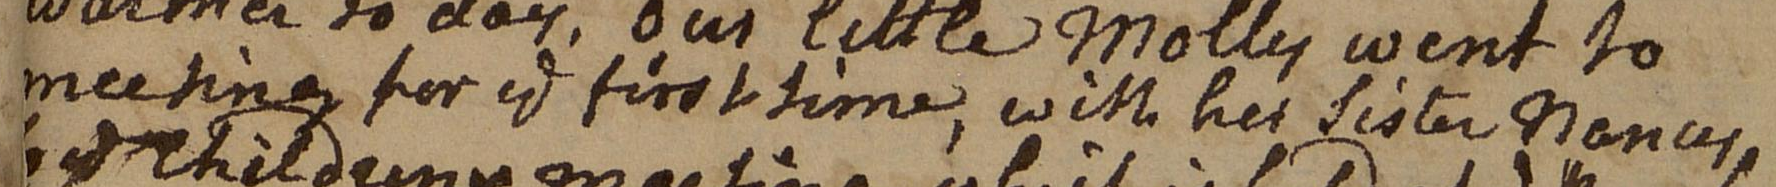meeting for y^e first time, with her sister Nancy,
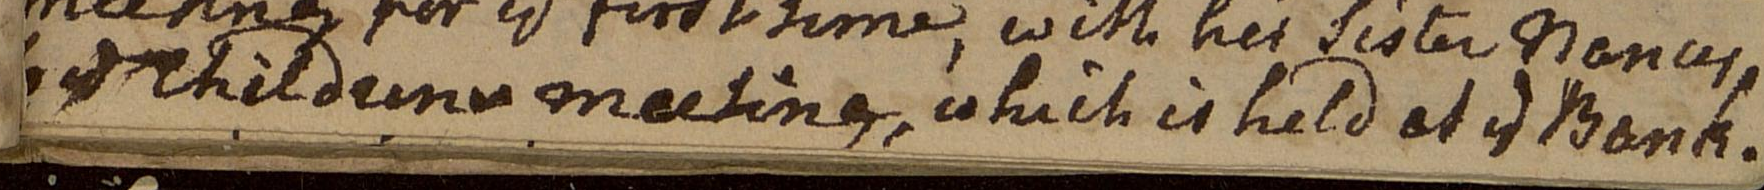y^e childrens meeting, which is held at y^e Bank.
